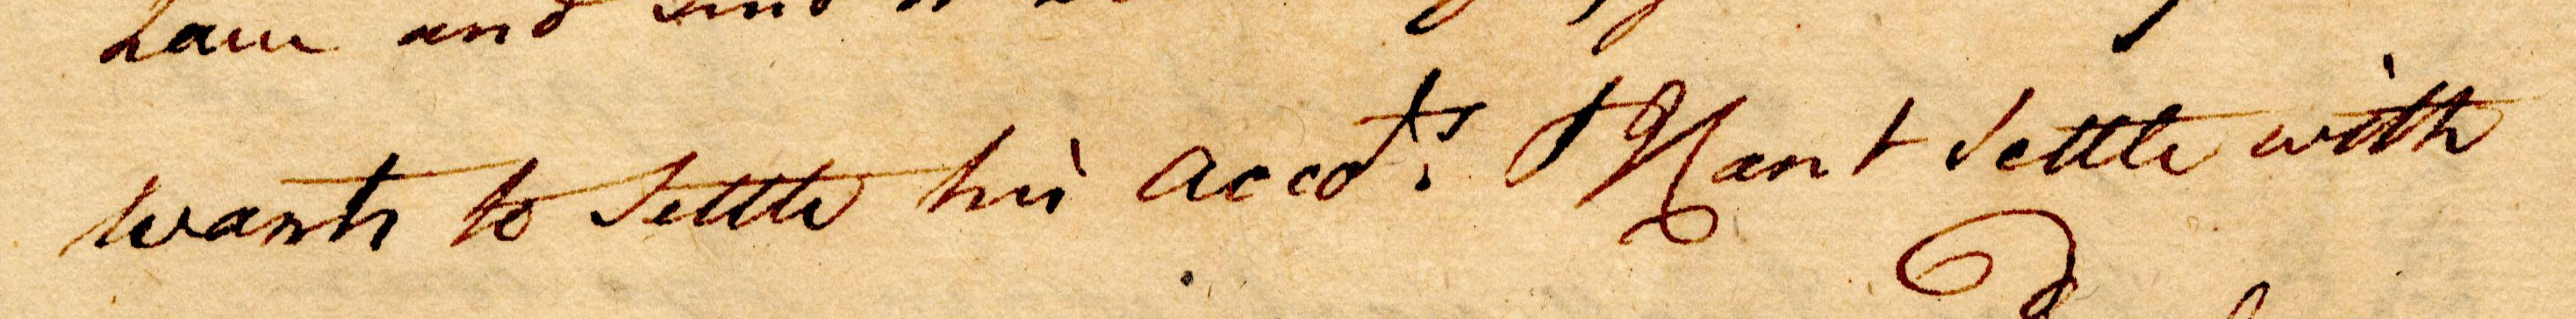wants to Settle his acco^ts. & I Cant Settle with
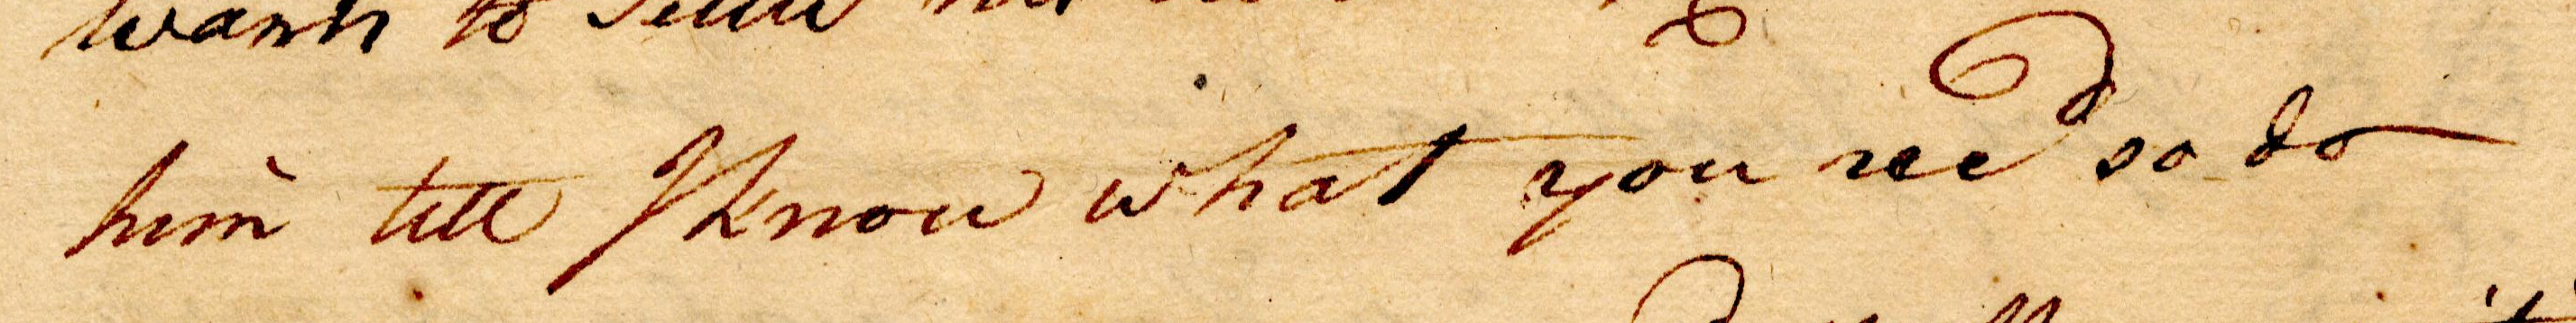him till I know what you rec^d so do
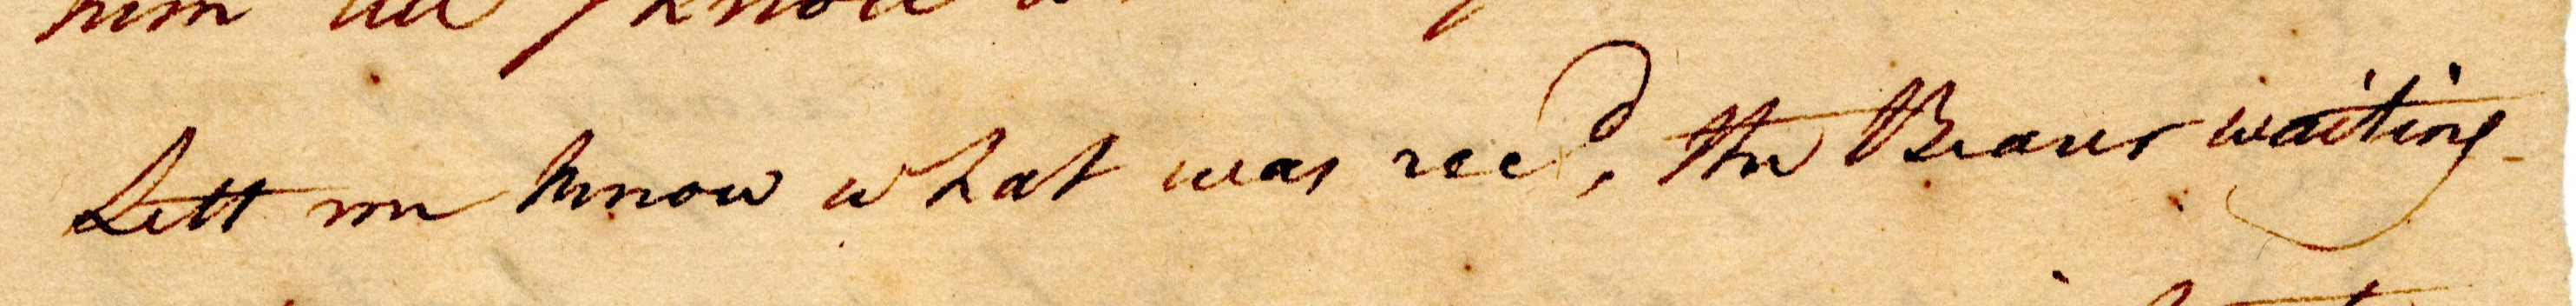Lett me know what was rec^d, the Beaver waiting
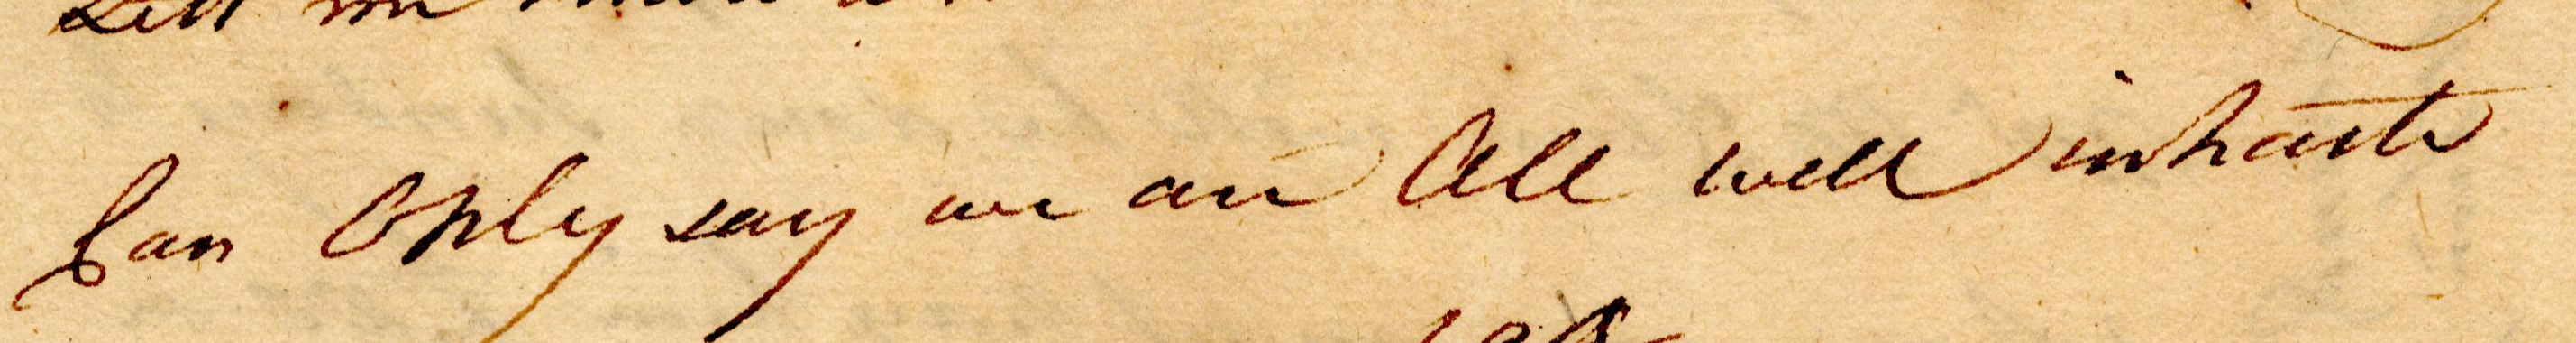Can Only say we are All well in health
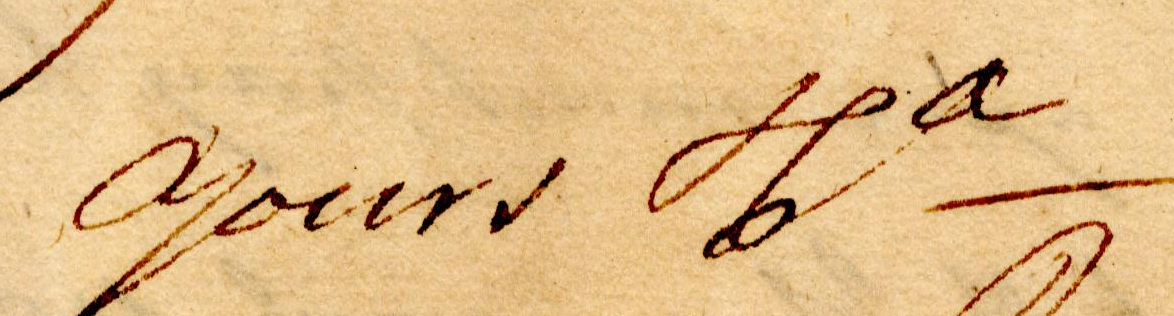yours &C^a-
